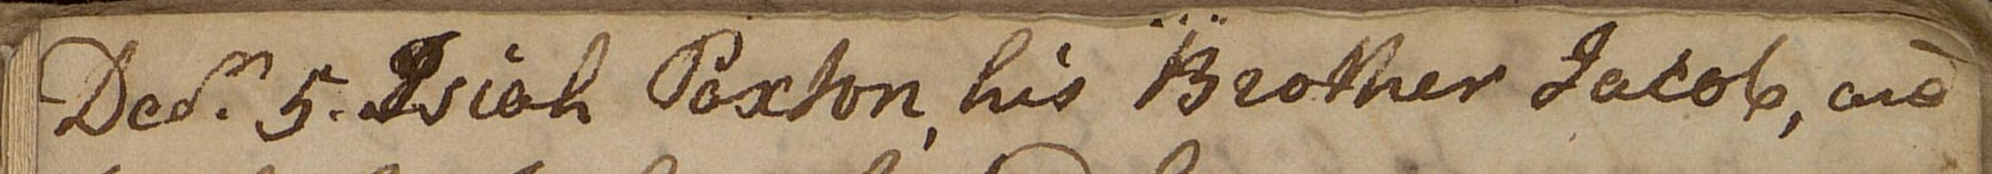Dec^r. 5 Isiah Paxton, his Brother Jacob, and
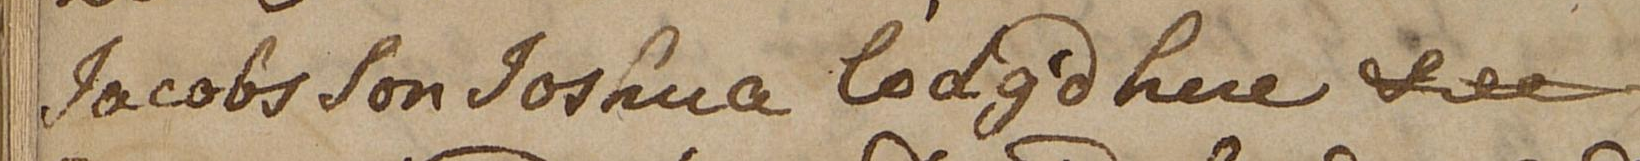Jacobs Son Joshua lodg'd here &c
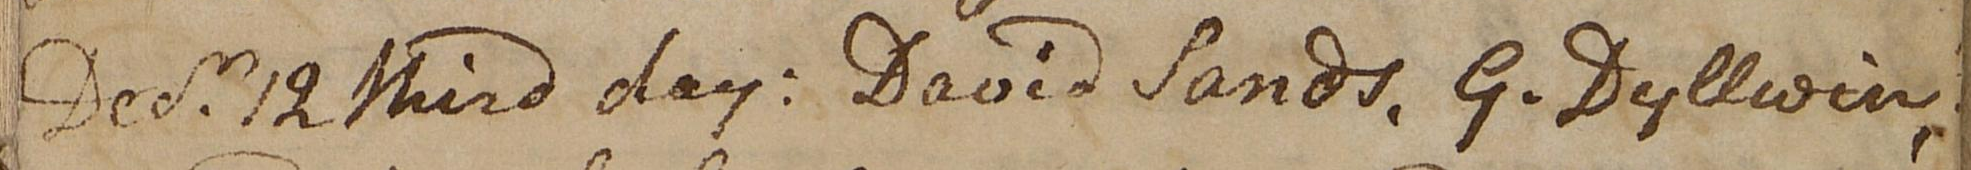Dec^r. 12 third day: David Sands, G. Dyllwin
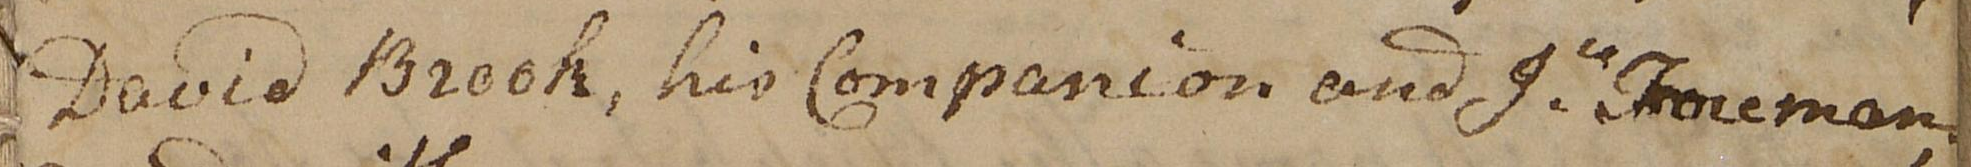David Brook, his Companion and J^u Foreman,
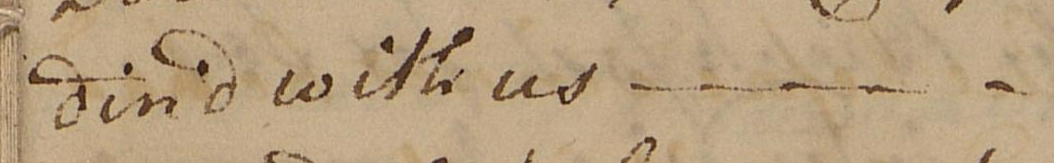din'd with us----
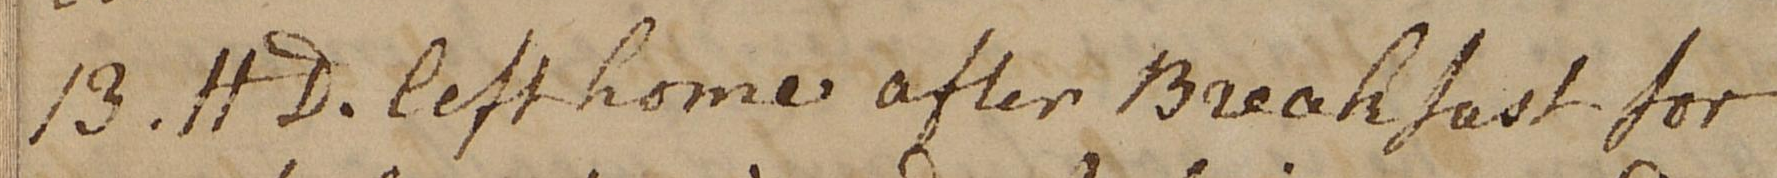13. HD. left home after Breakfast for
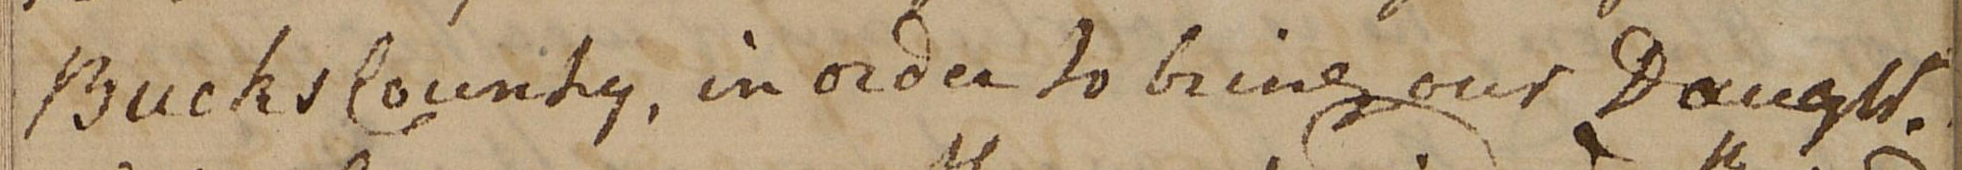Bucks County, in order to bring our Daught,
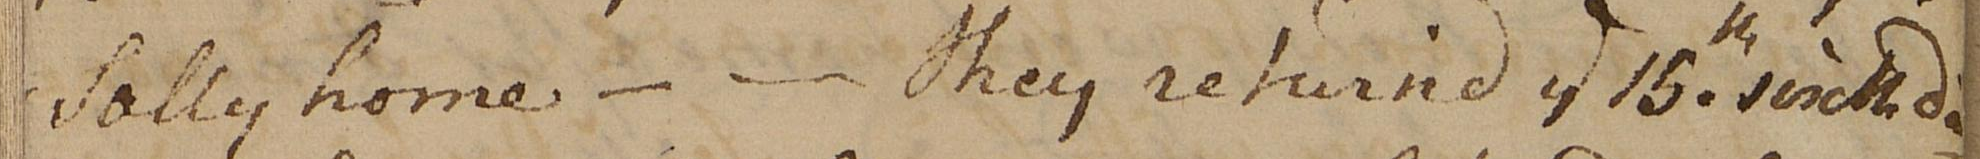Sally home.-- they return'd y^e 15^th. sixth d.
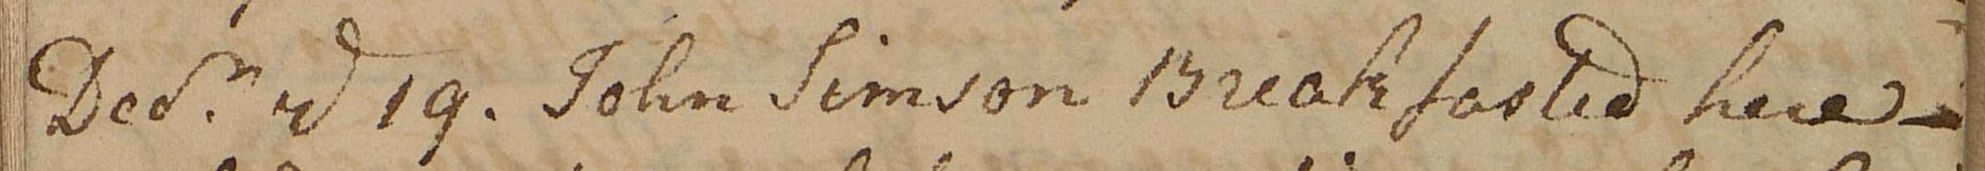Dec^r. y^e 19. John Simson Breakfasted here-
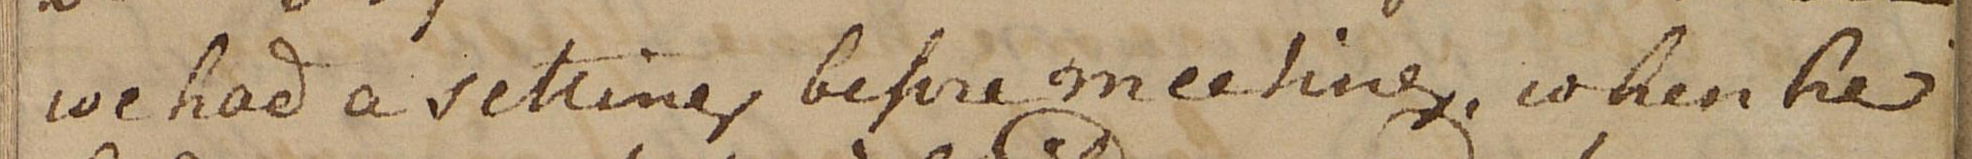we had a setting before meeting, when he
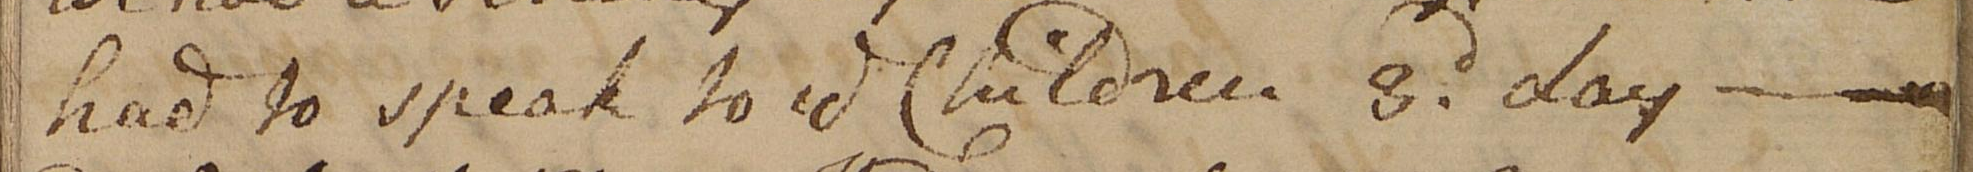had to speak to y^e Children 3^d. day-
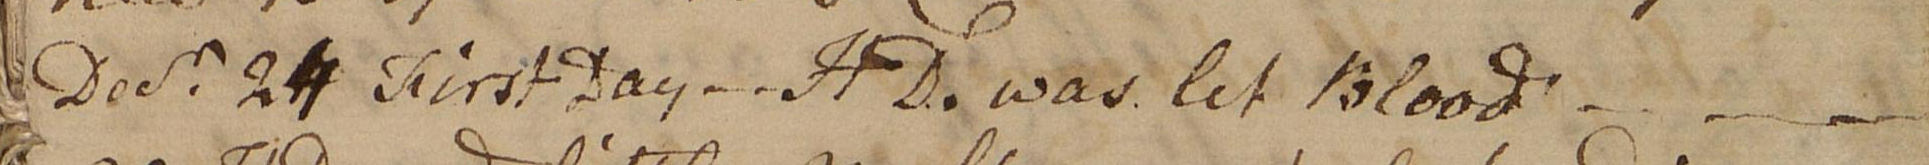Dec^r. 24 First Day-. HD. was let Blood---
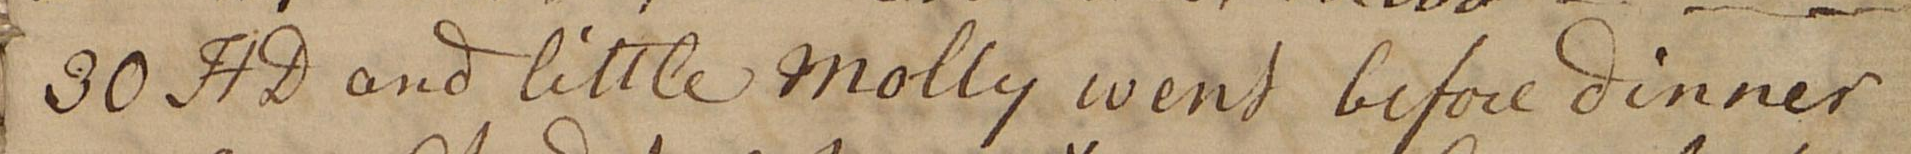30 HD and little molly went before dinner
